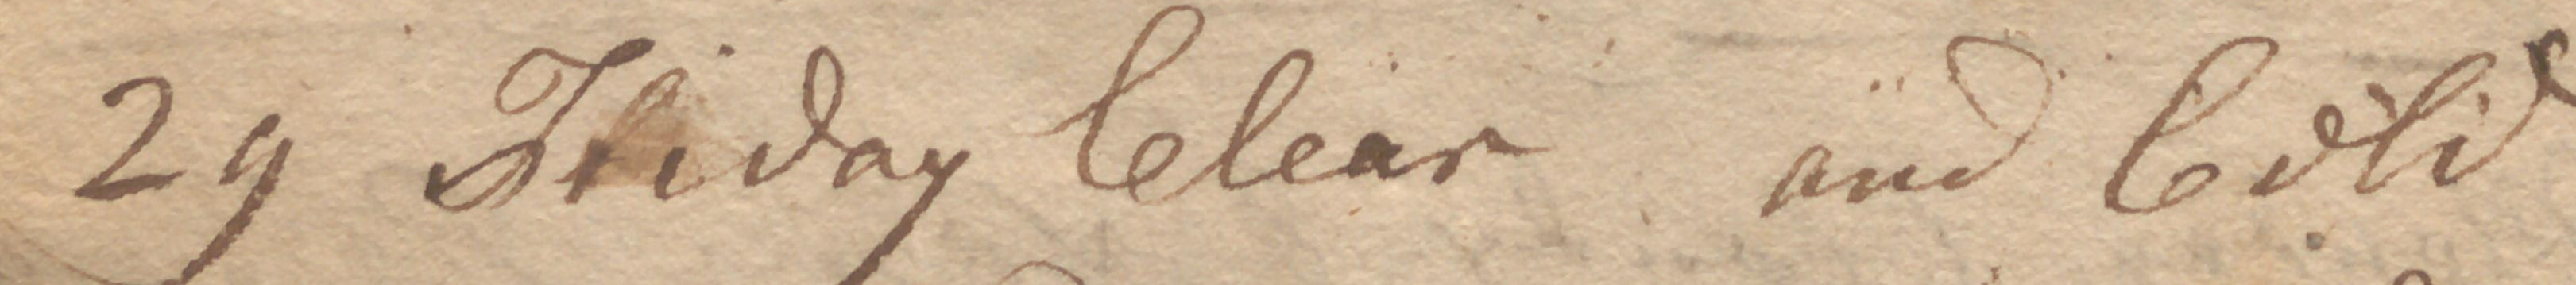29 Friday Clear and Cold
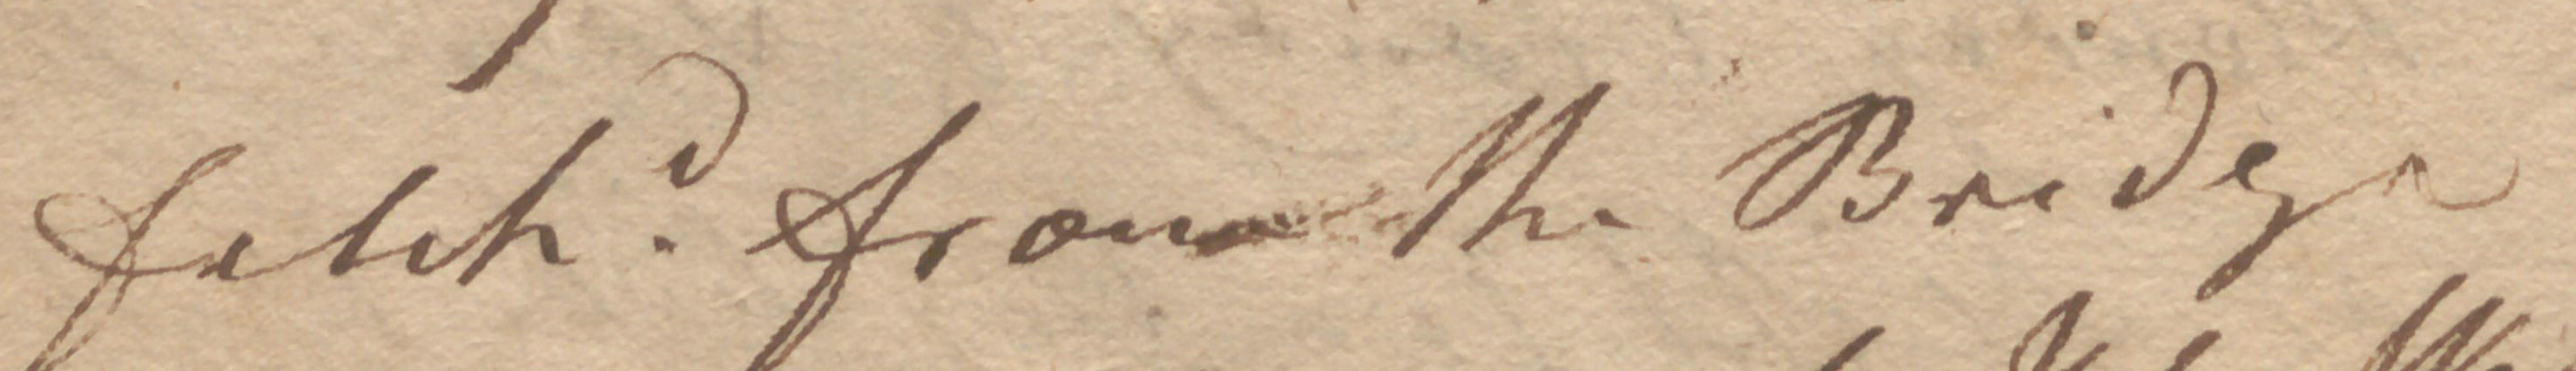fetch^d. fron the Bridge
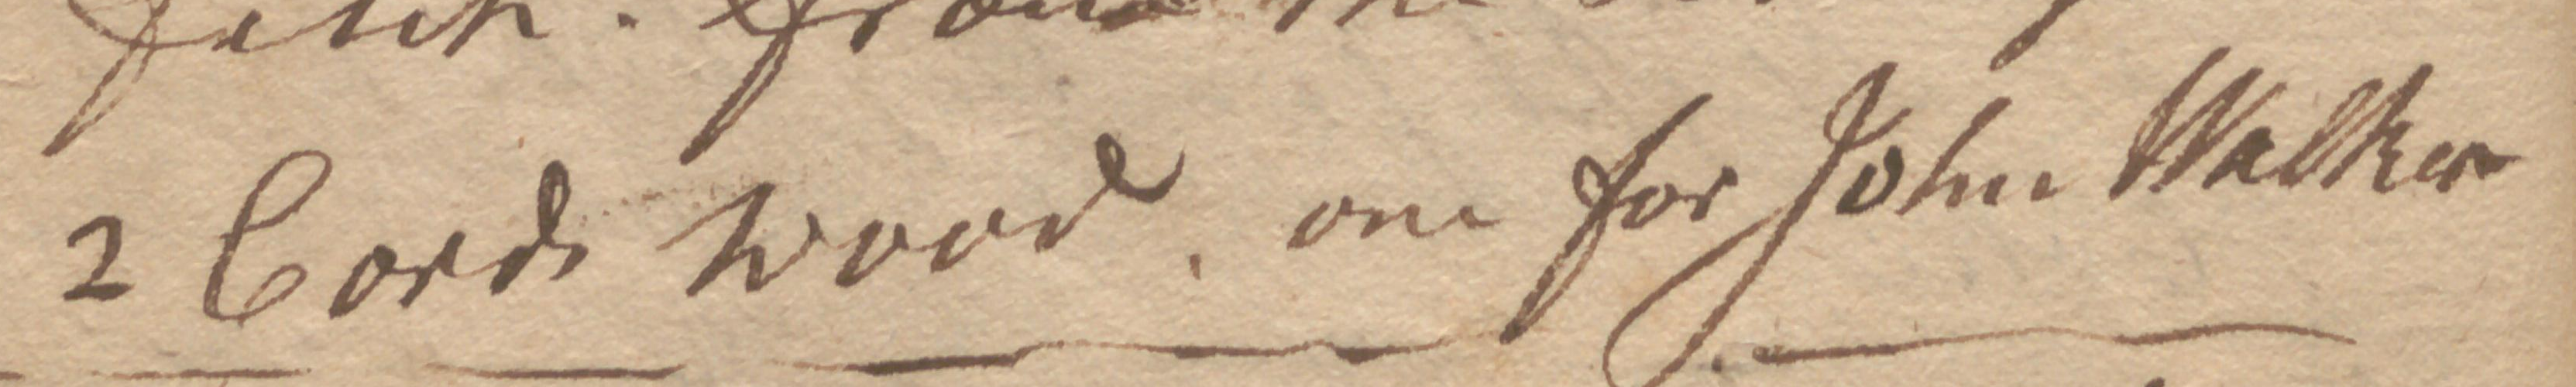2 Cords wood, one for John Walker
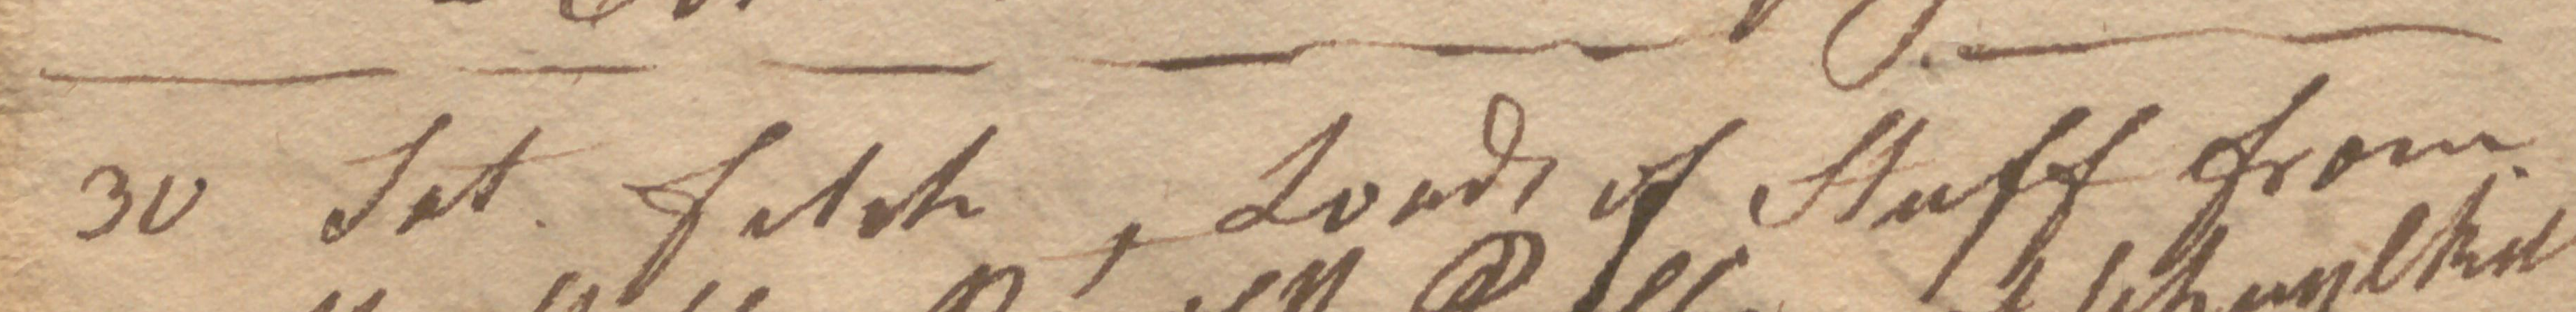30 Set. fetch Loads of Stuff from
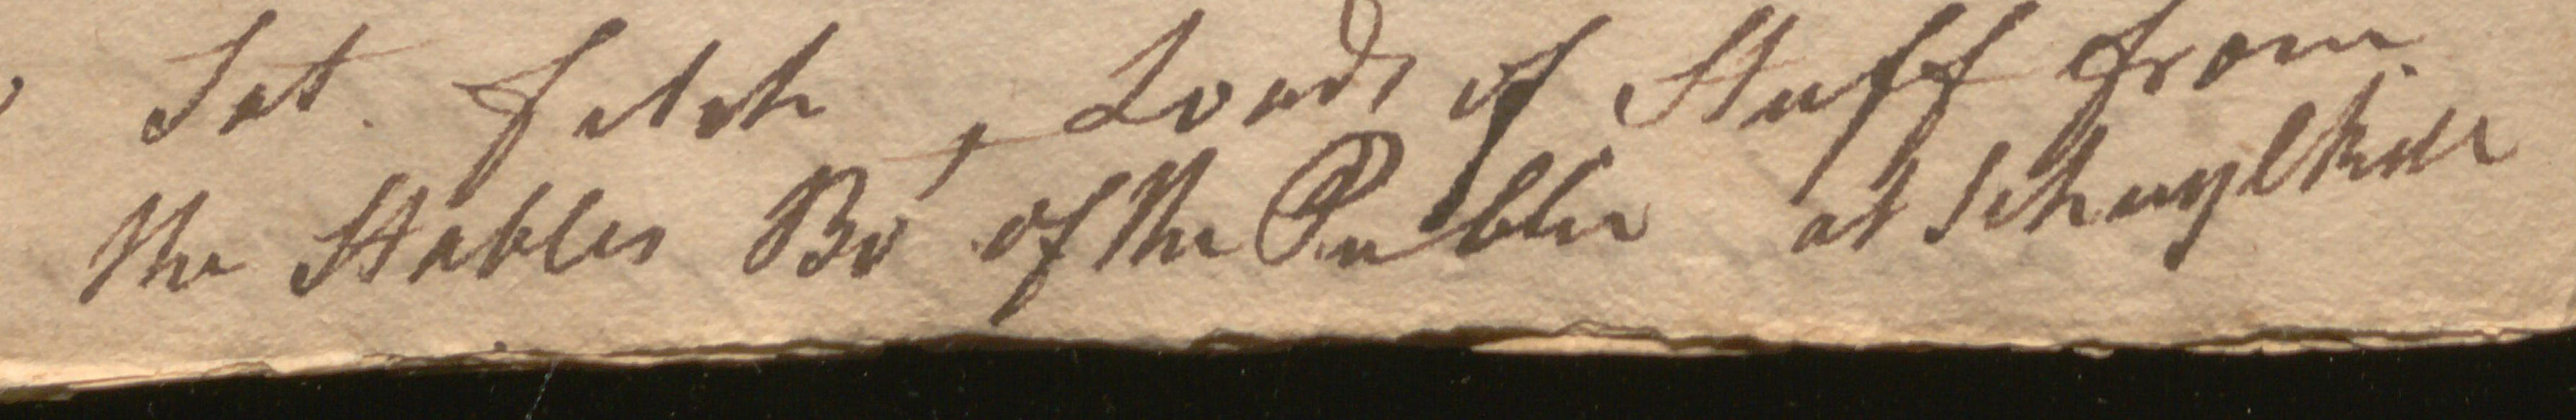the Stables Bo^t. of the Public at Schuylkill
